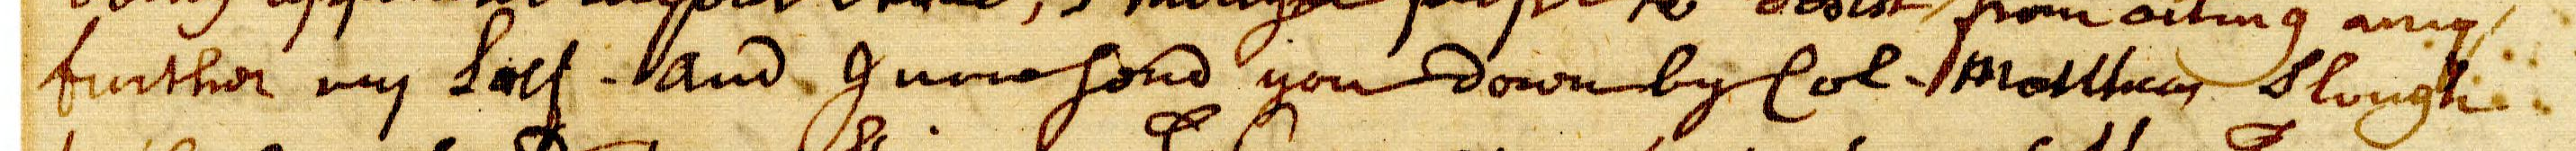further my Last - And I now send you down by Col. Mattheas Slough
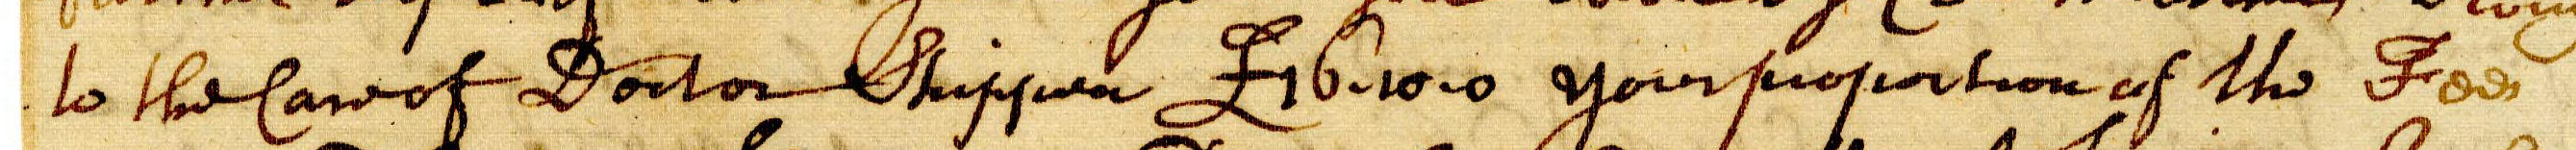to the Care of Doctor Shippen £16.10.0 Your proportion of the Fees
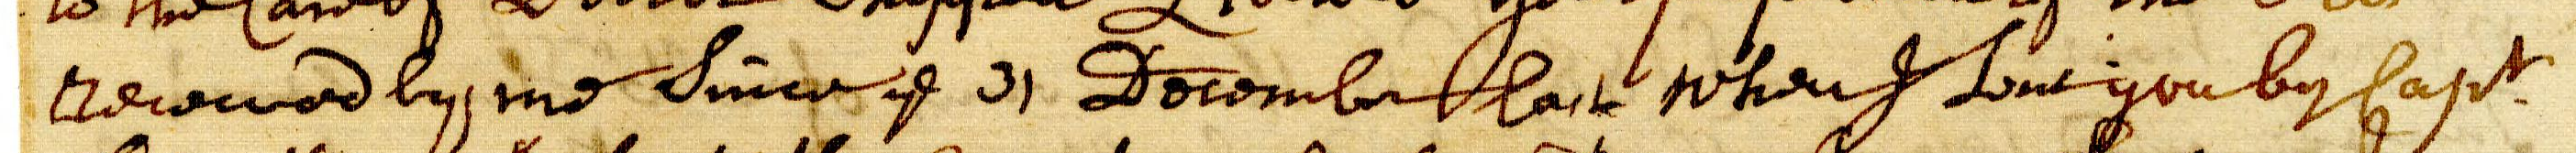received by me Since y^e 31 December last when I sent you by Cap^t.
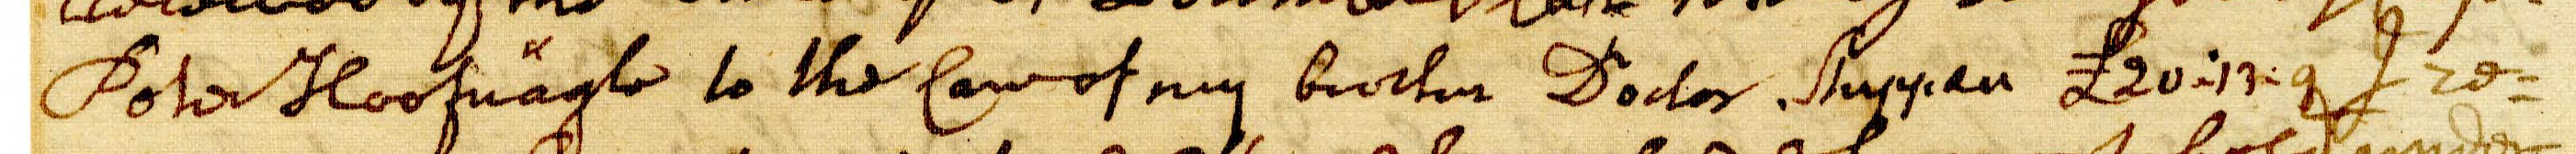Peter Hoofnagle to the Care of my brother Doctor Shippen £20.13.9 I re-
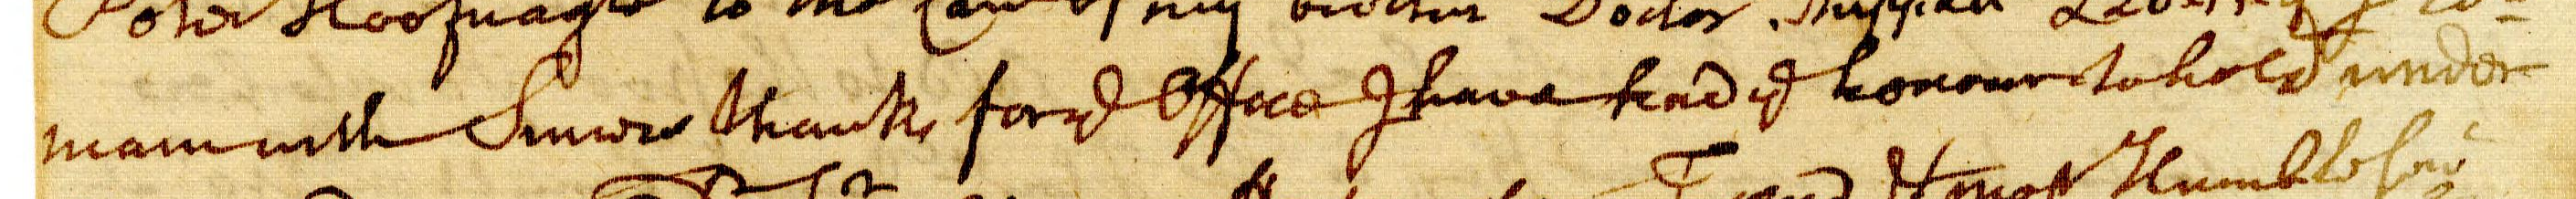main with Sincere thanks for y^e Office I have had y^e honour to hold under
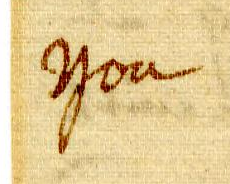you
